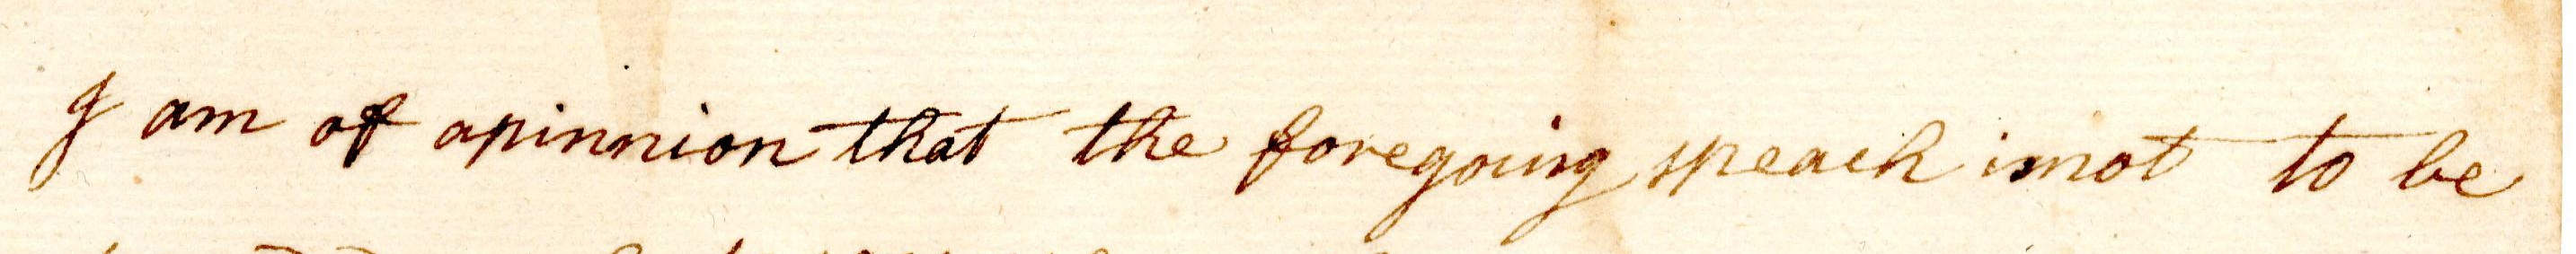I am of opinnion that the foregoing speach is not to be
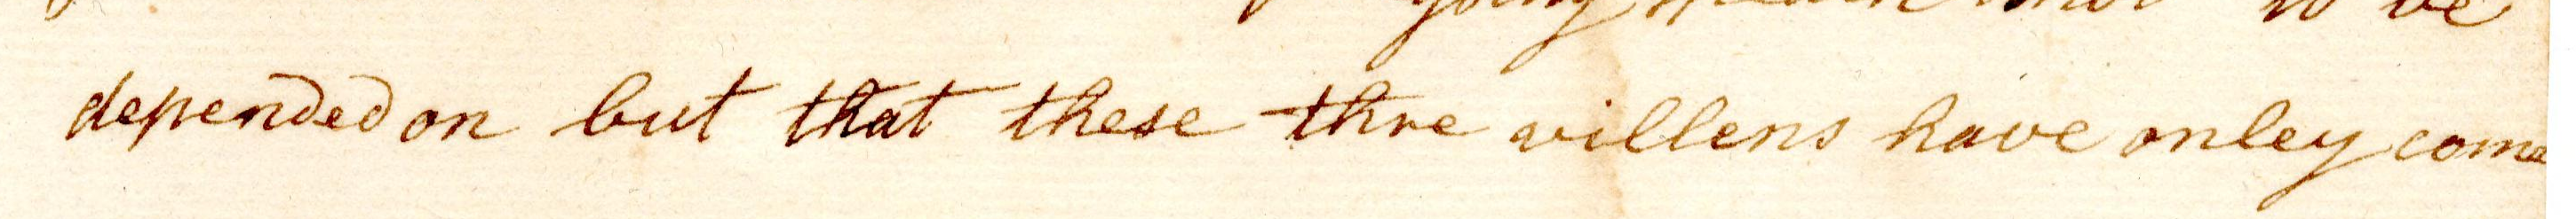depended on but that these thre villens have onley come
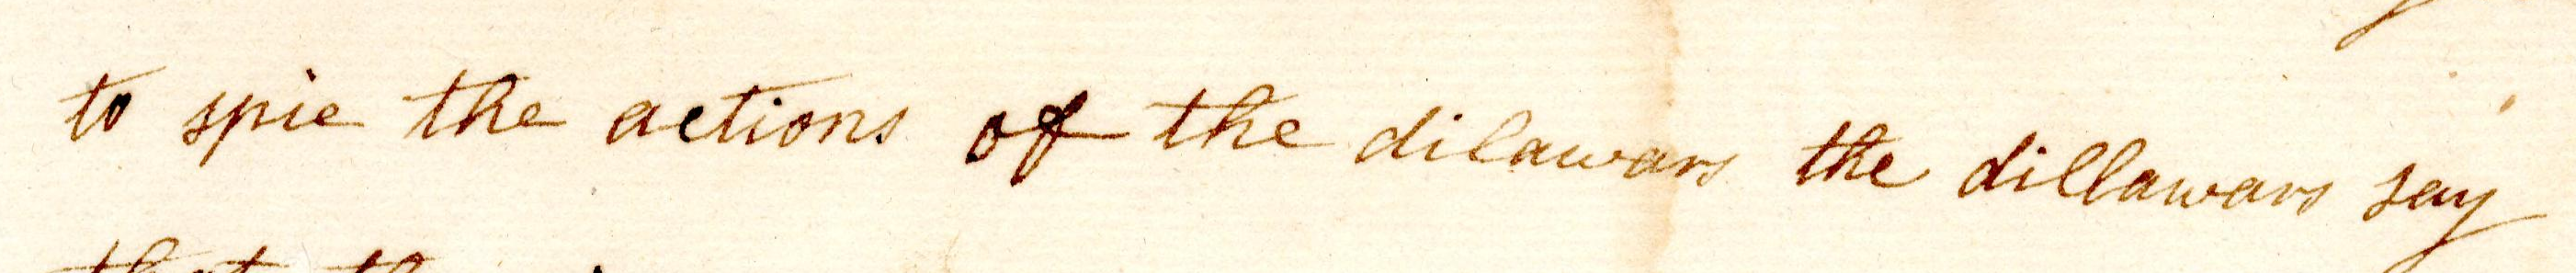to spie the actions of the dilawars the dillawars say
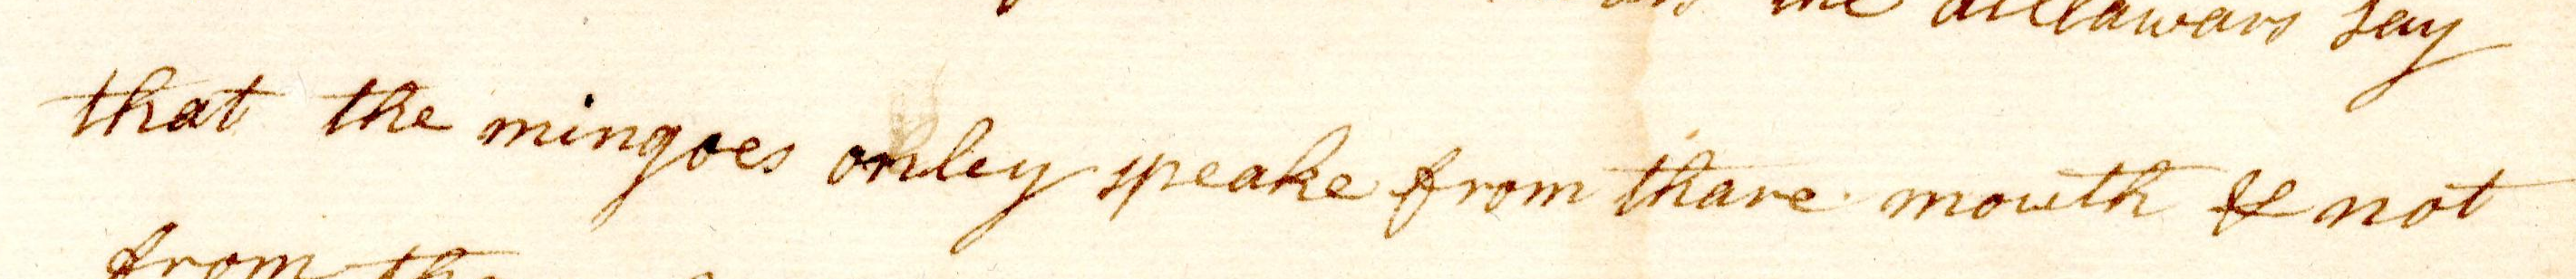that the mingoes onley speake from thare mouth & not
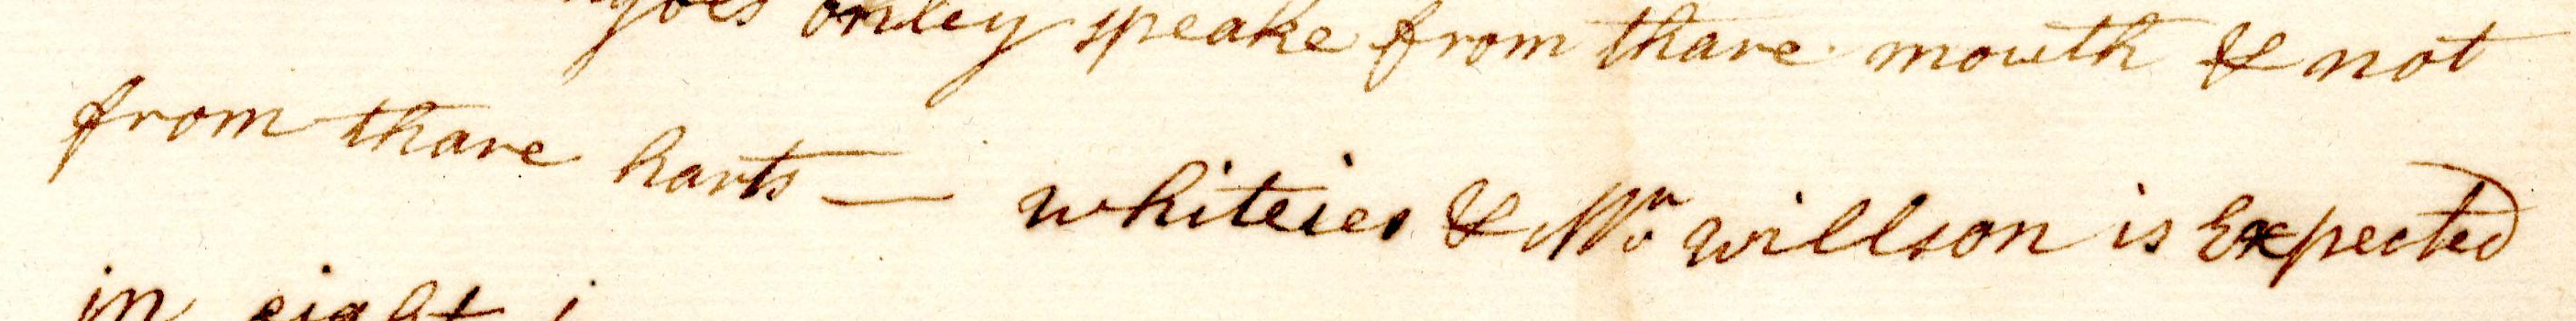from thare harts- whiteies & M^r. willson is expected
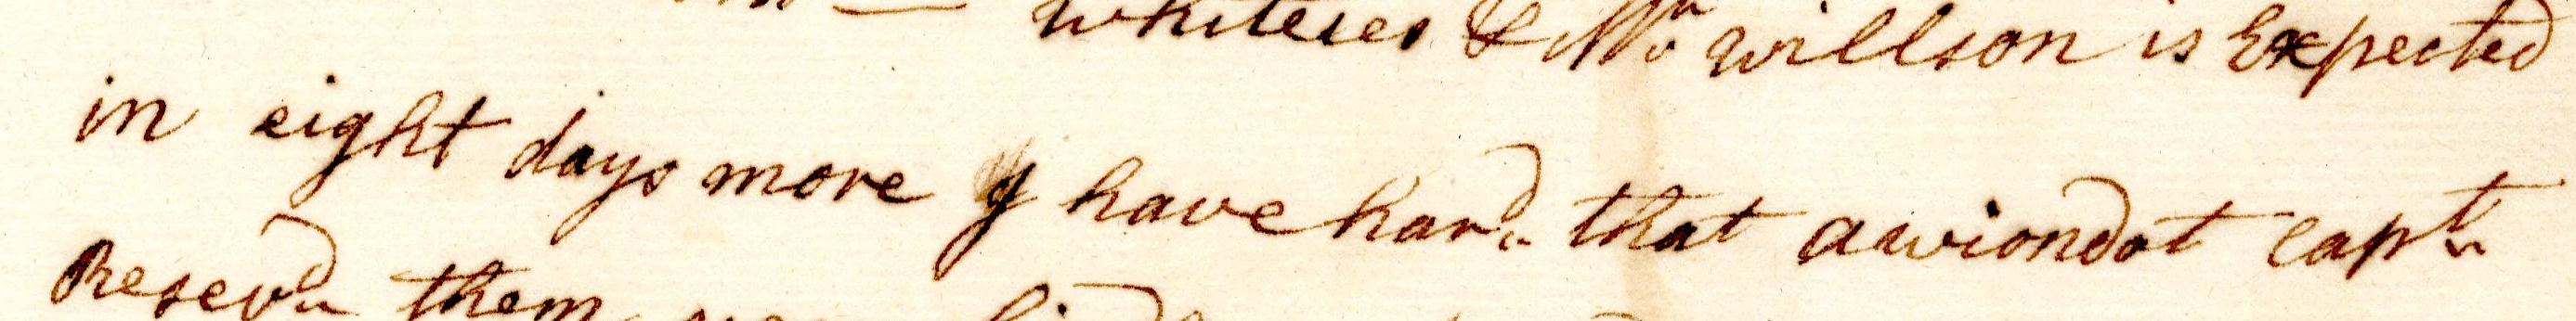in eight days more I have har^d. that a wiondot cap^t
